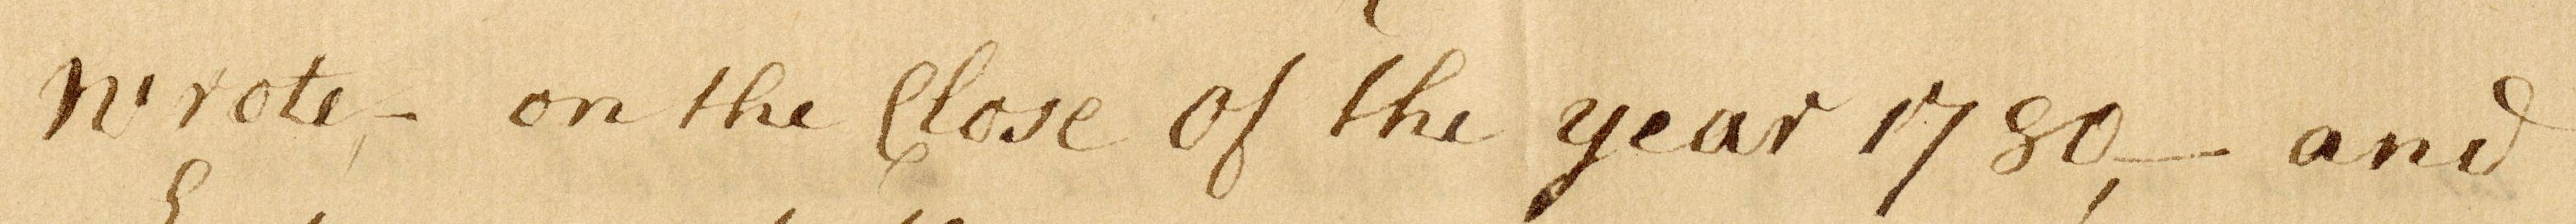Wrote- on the Close of the year 1780- and
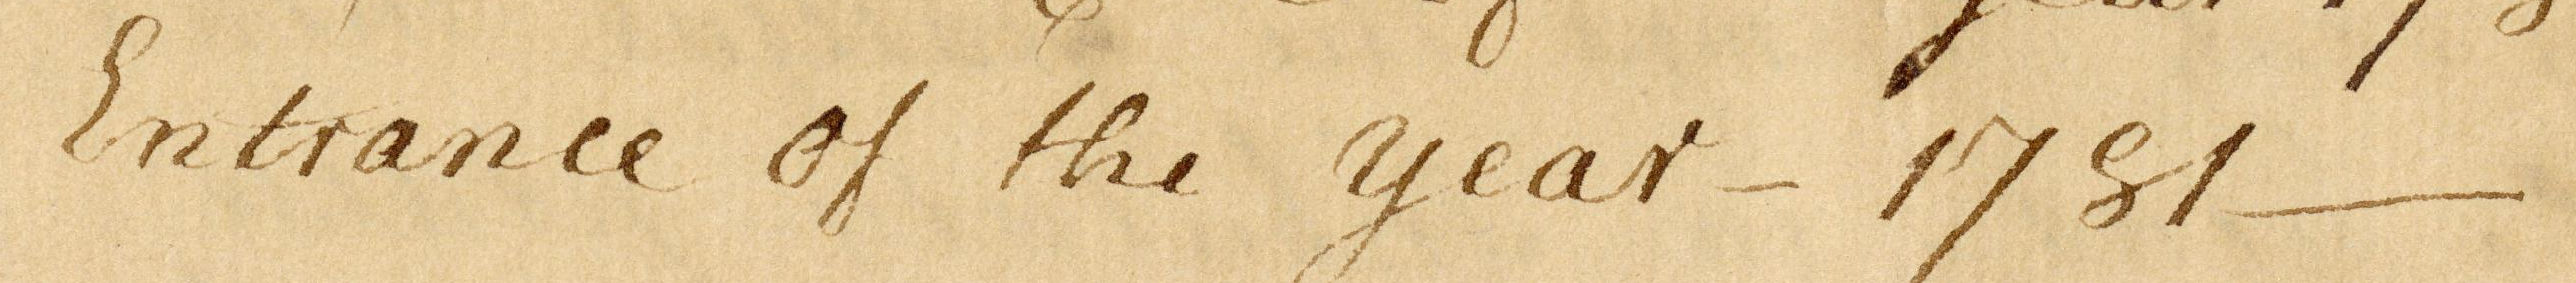Entrance of the year- 1781-
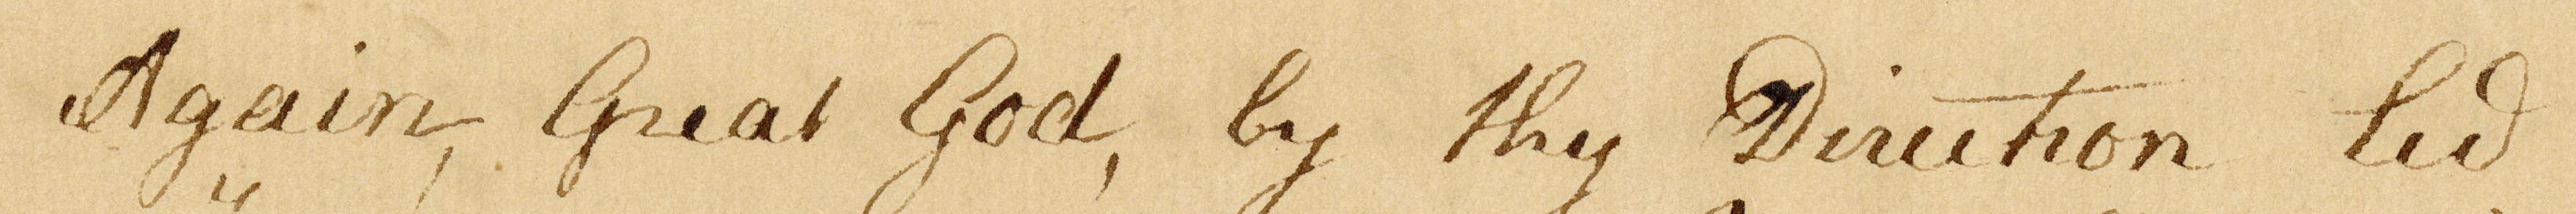Again, Great God, by thy Direction led
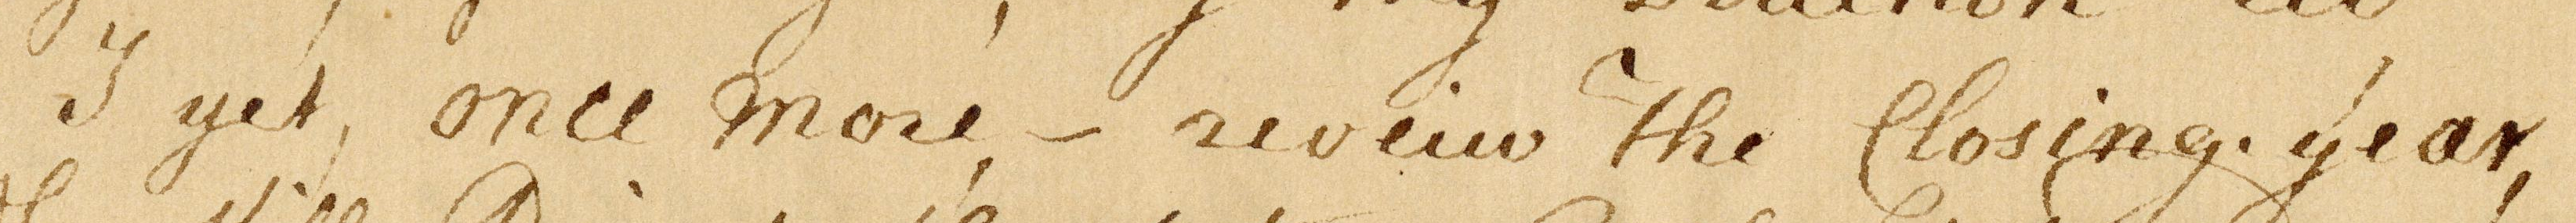I yet, once more- reveiw the Closing year,
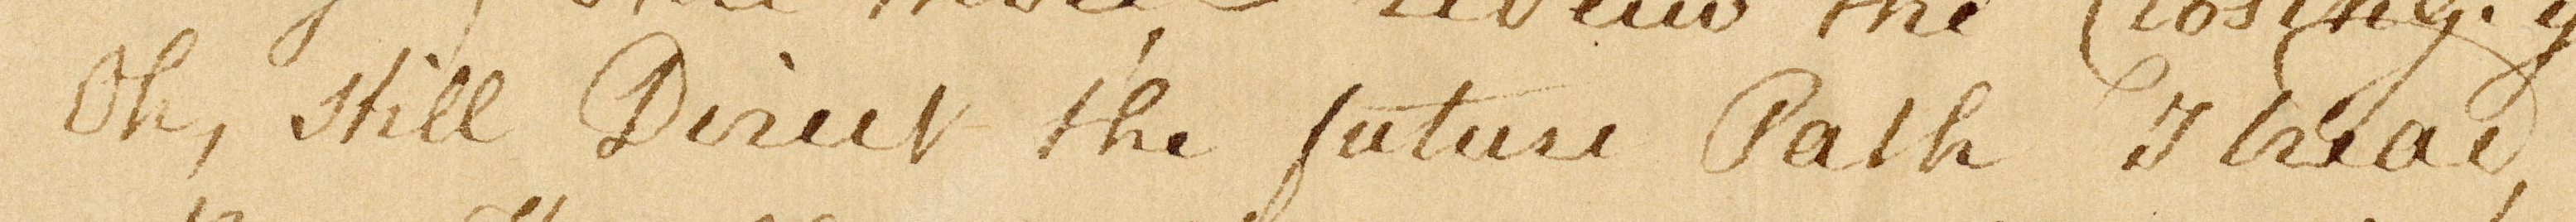Oh, still Direct the future Path I heal
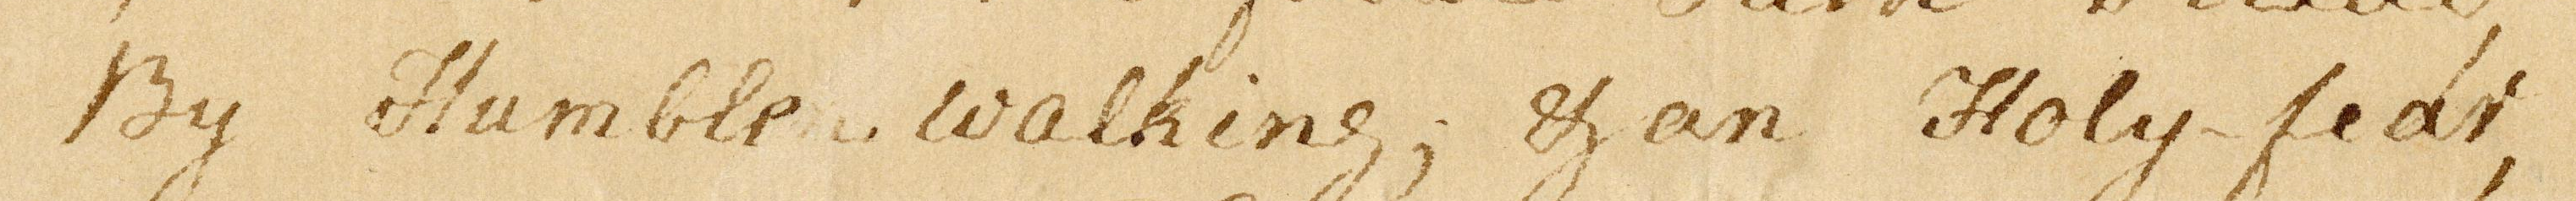By Humble walking; & an Holy-fear;
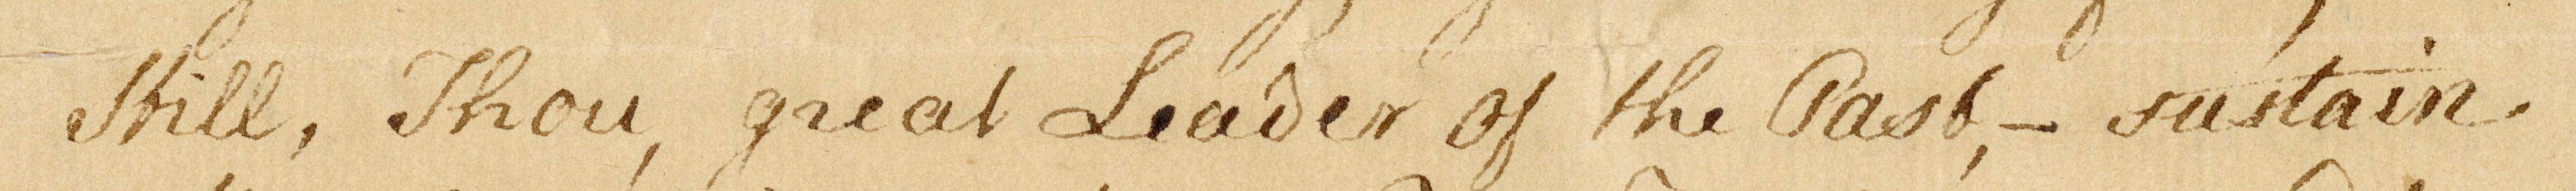Still, Thou great Leader of the Past,- sustain
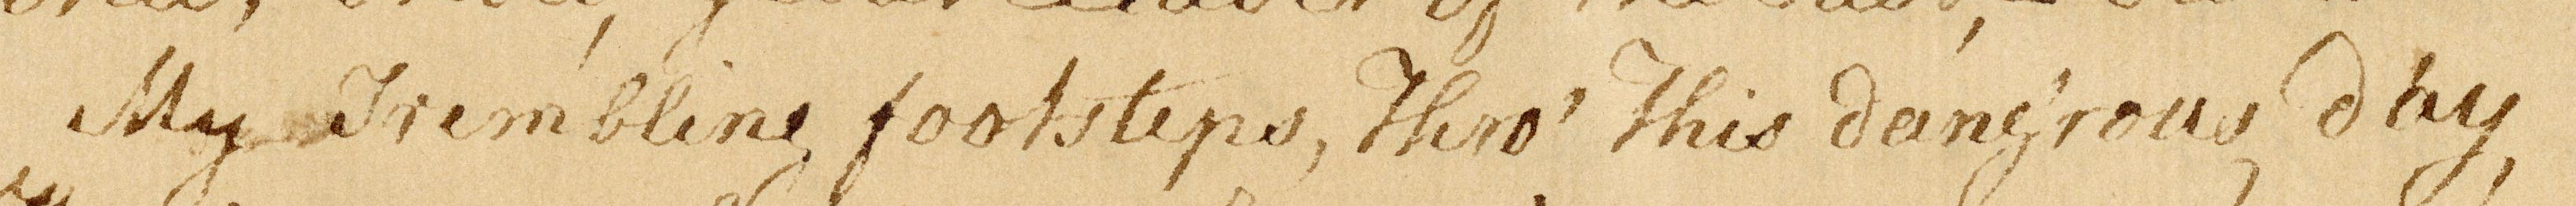My Trembling footsteps, Thro; this dang'rous day,
